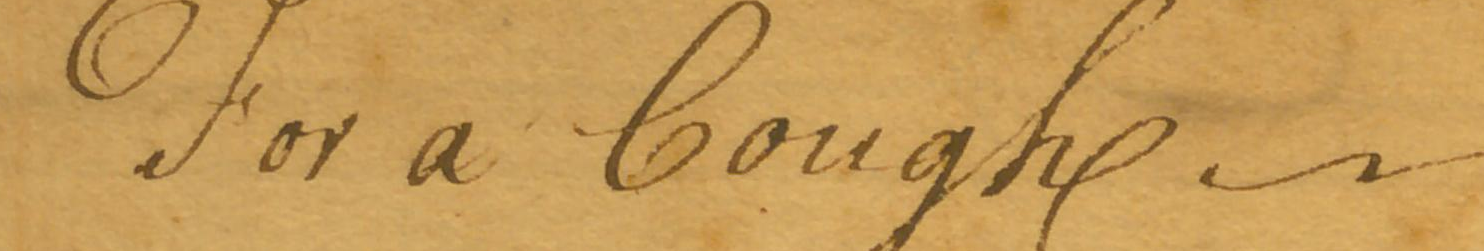For a Cough-
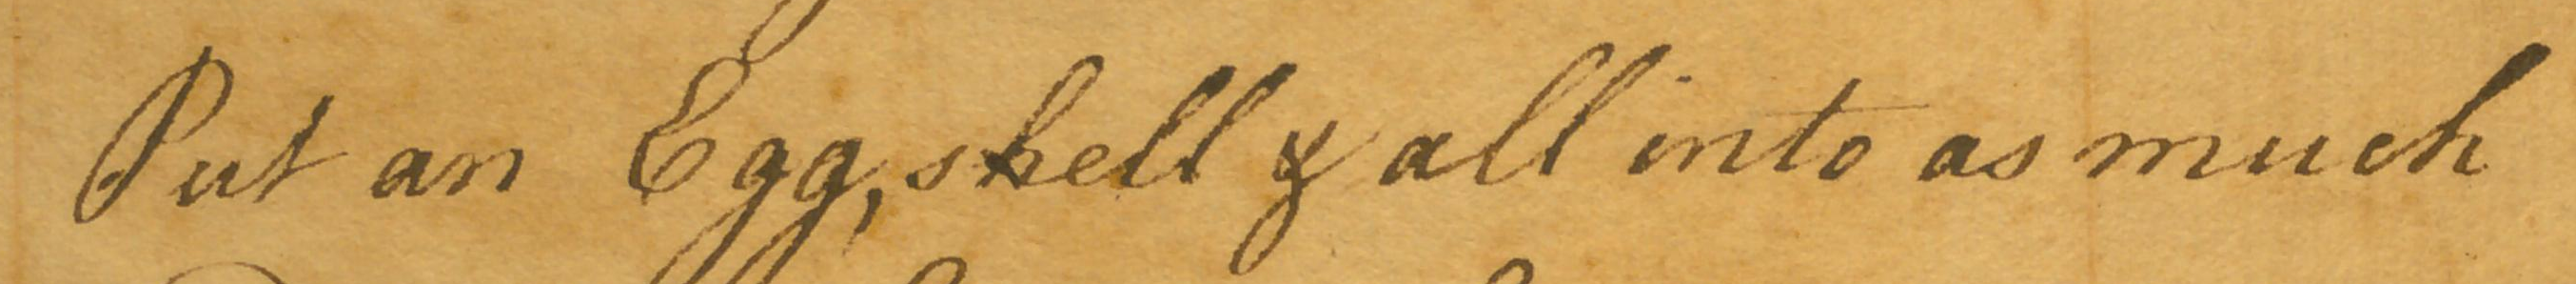Put an Egg, shell & all into as much
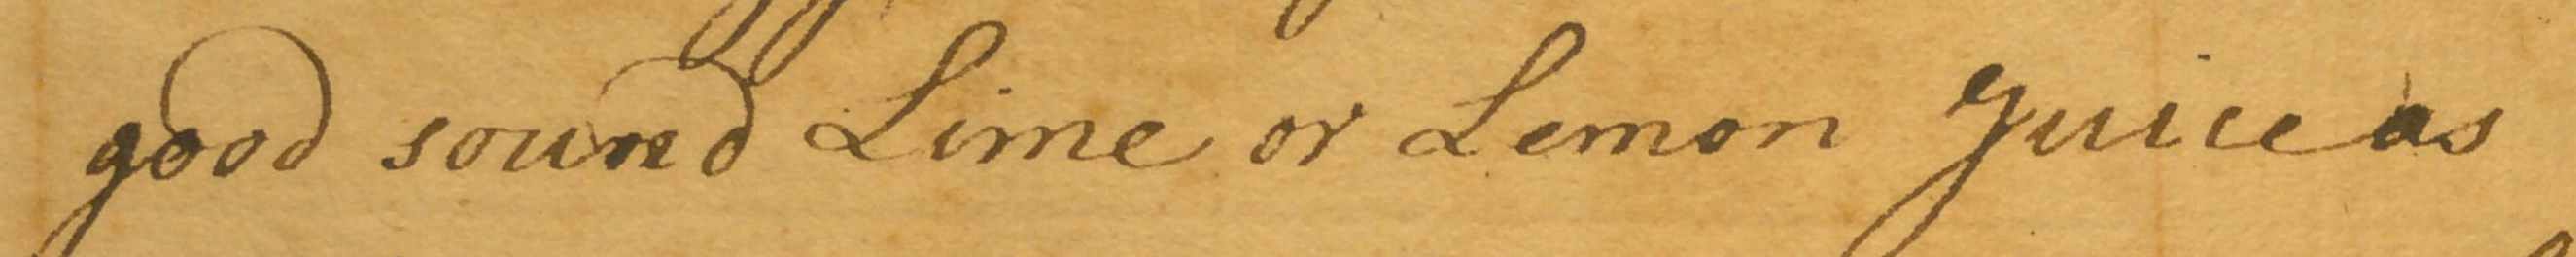good sound Lime or Lemon juice as
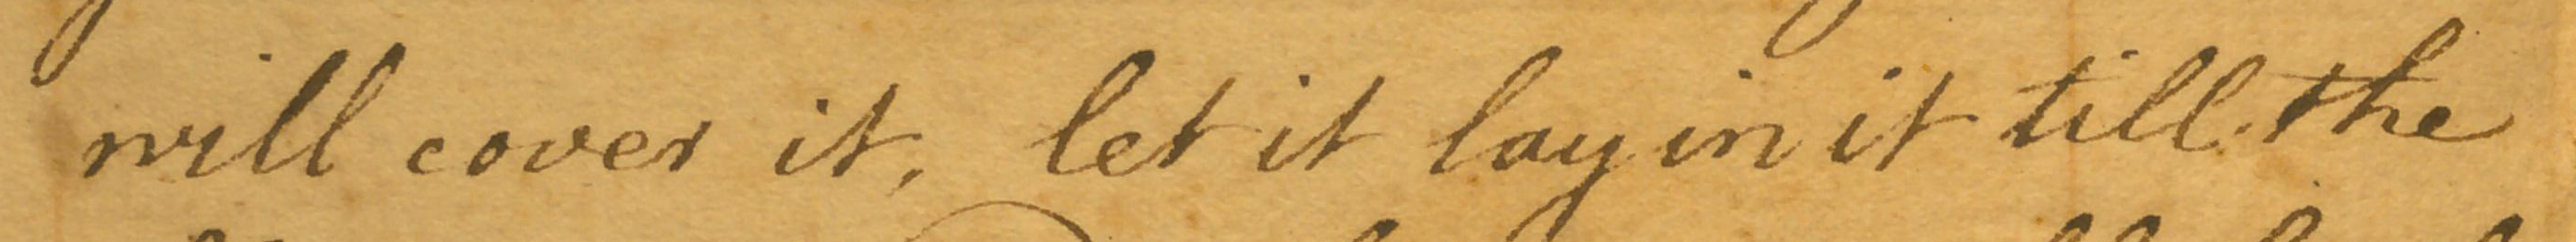will cover it, let it lay in it till the
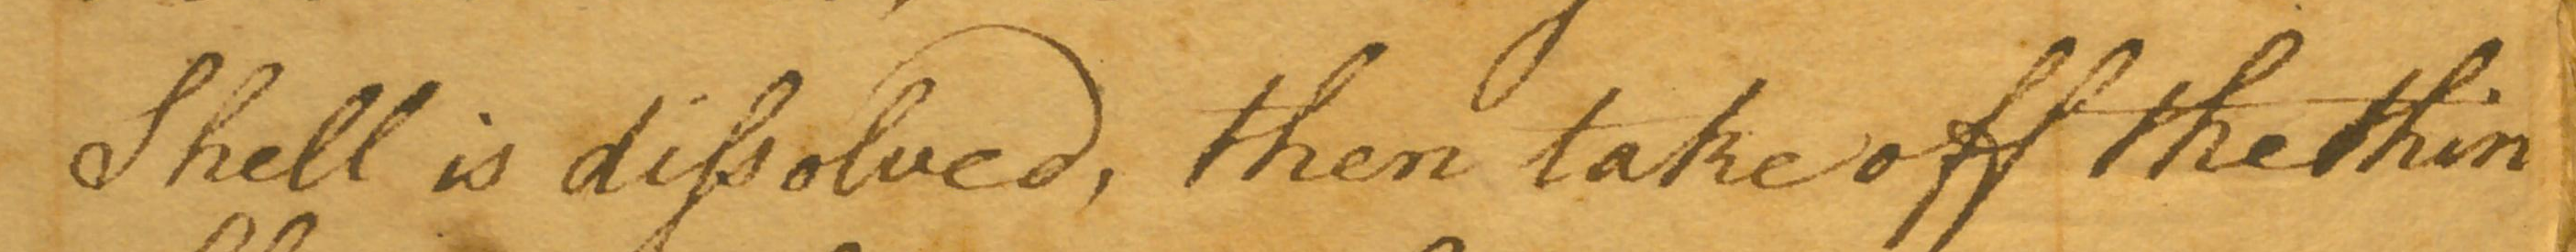Shell is dissolved, then take off the thin
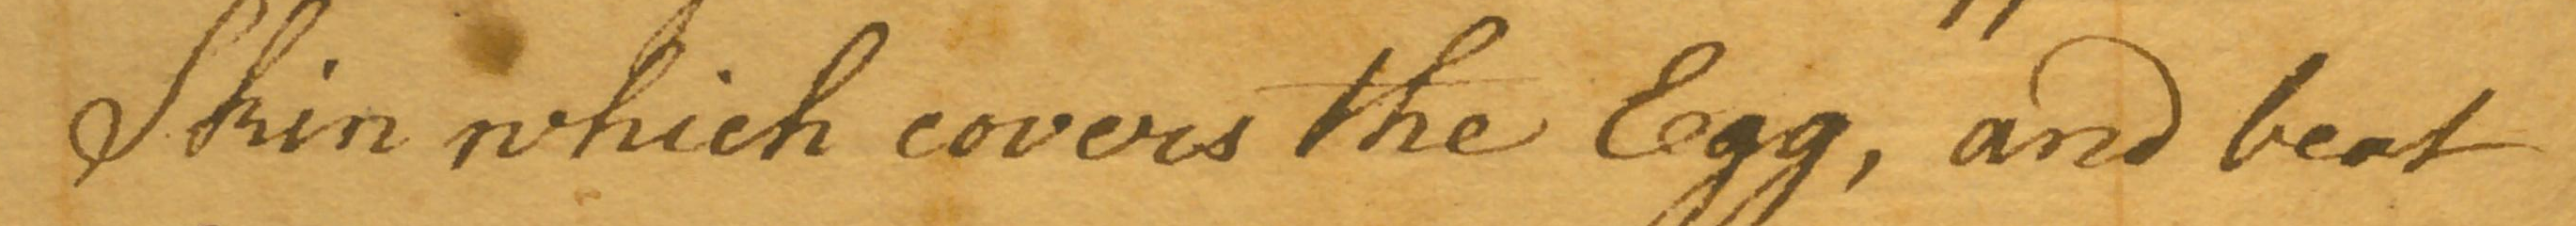skin which covers the Egg, and beat
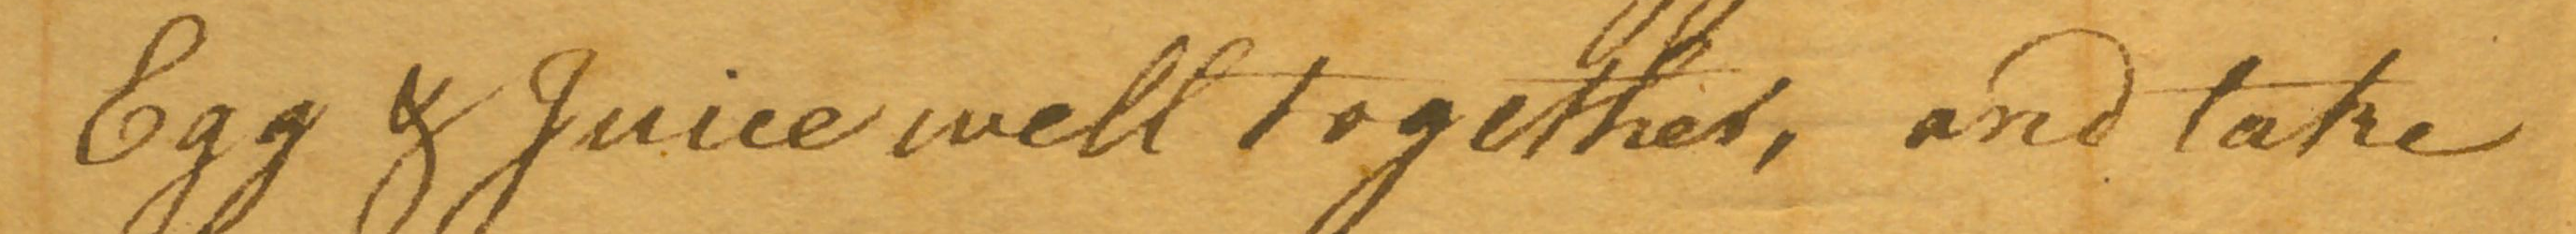Egg & Juice well together, and take
